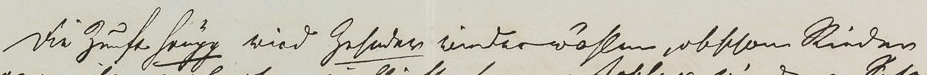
Die Zunft Höngg wird Zehnder wiederwählen, obschon Rieder
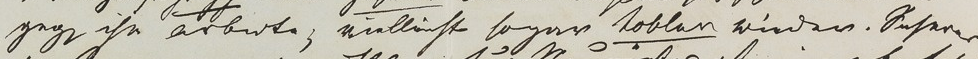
gegen ihn arbeite, vielleicht sogar Tobler wieder. Sicheres
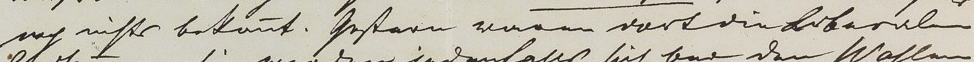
noch nichts bekannt. Gestern waren dort die Liberalen
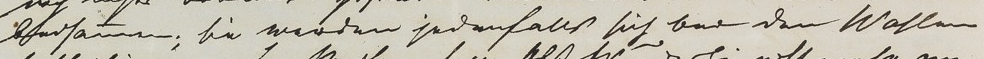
beisammen; sie werden jedenfalls sich bei den Wahlen
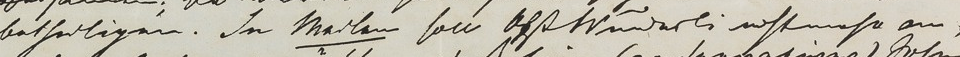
betheiligen. In Meilen soll Oberst Wunderli nicht mehr an-
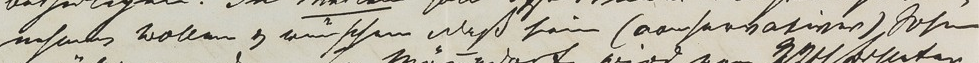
nehmen wollen & wünschen daß sein (conservativer) Sohn
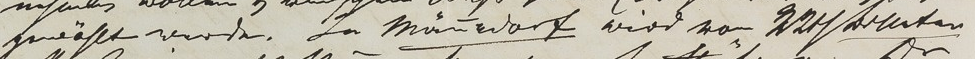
gewählt werde. In Männedorf wird von RRth Billeter
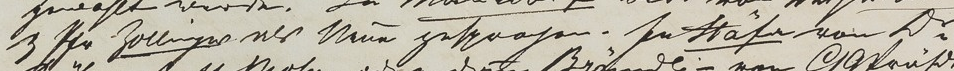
& Pfr. Zollinger als Neue gesprochen. In Stäfa von Dr
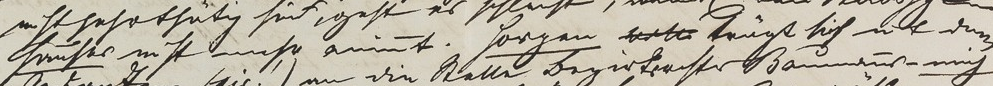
nicht mehr annimmt. Horgen trägt sich mit dem
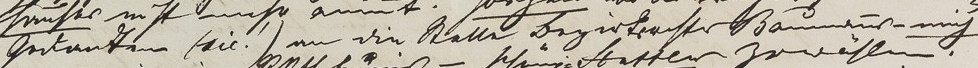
Gedanken an die Stelle Bezirksrchtr Baumanns ­ mich
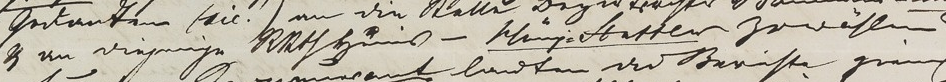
& an diejenige RRth Hünis­Hüny-Stettler zu wählen.
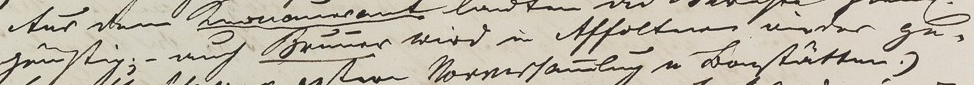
günstig; ­ auch Brunner wird in Affoltern wieder ge-
